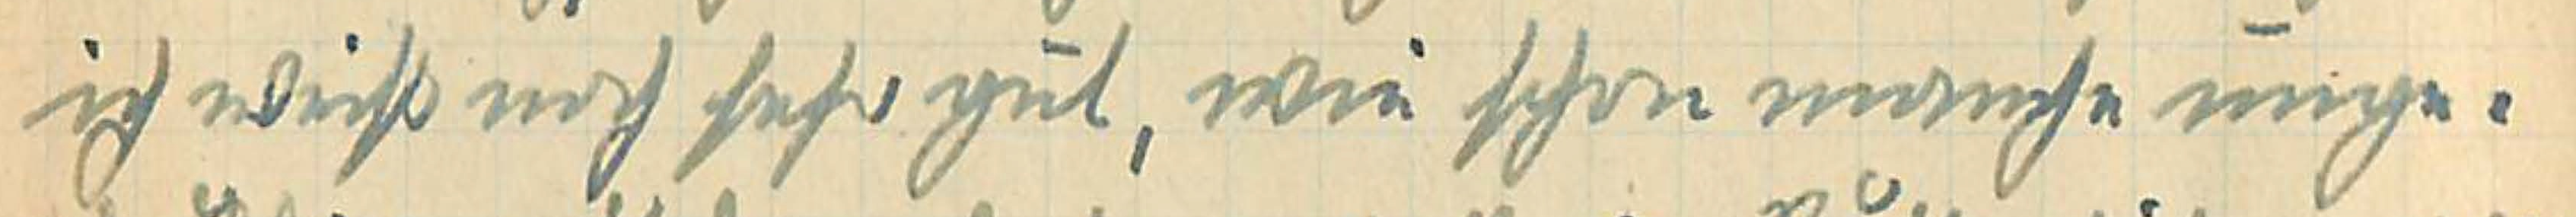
ich weiß noch sehr gut, wie schon manche unge-
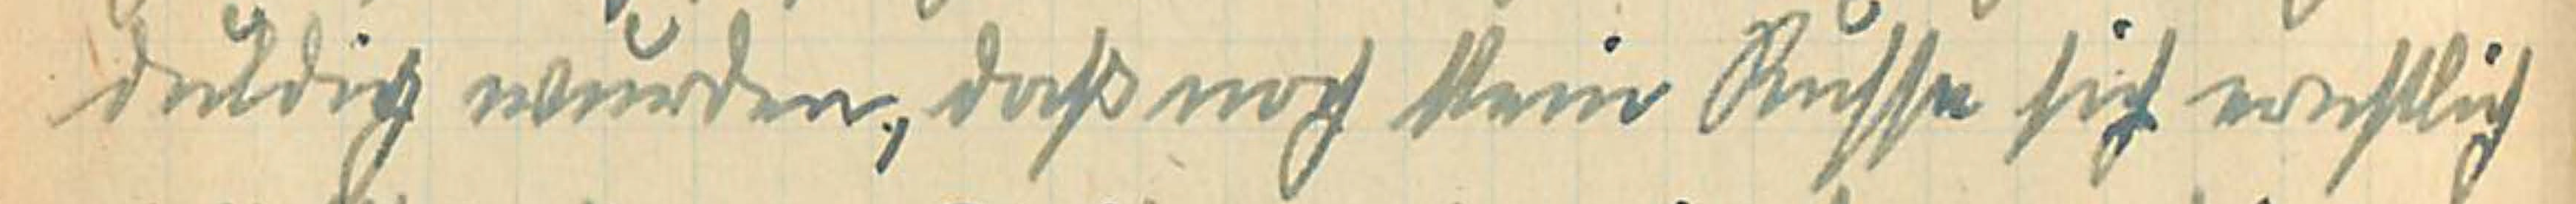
duldig wurden, daß noch kein Russe sich ernstlich
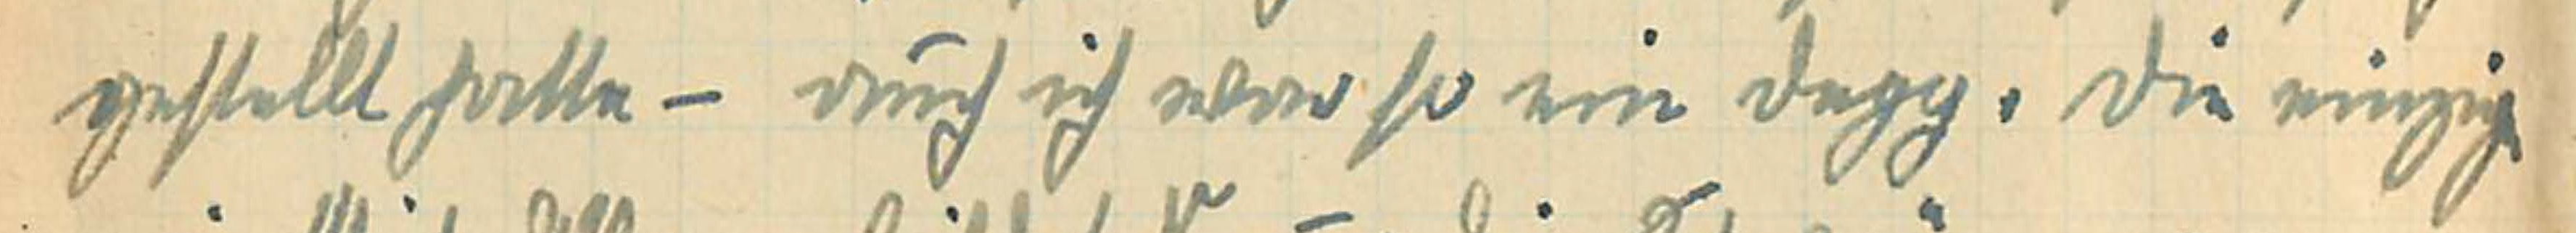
gestellt hatte – auch ich war so ein Depp. Die einzige
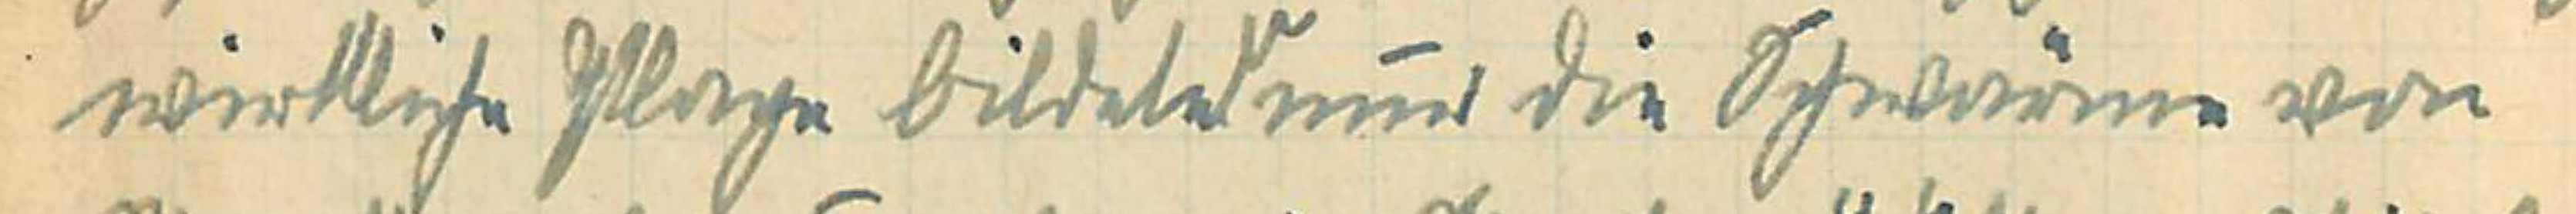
wirkliche Plage bildeten nur die Schwärme von
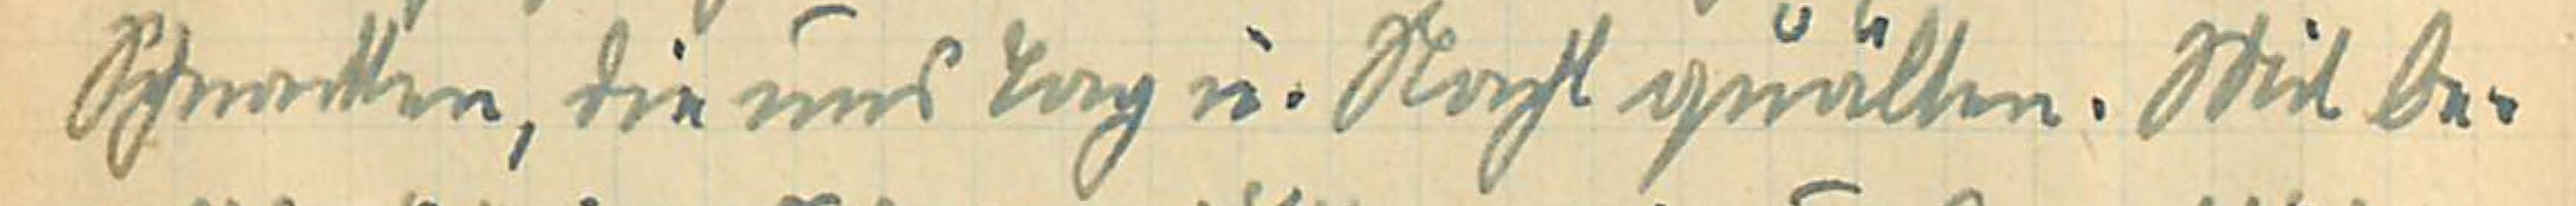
Schnacken, die uns Tag u. Nacht quälten. Mit be-
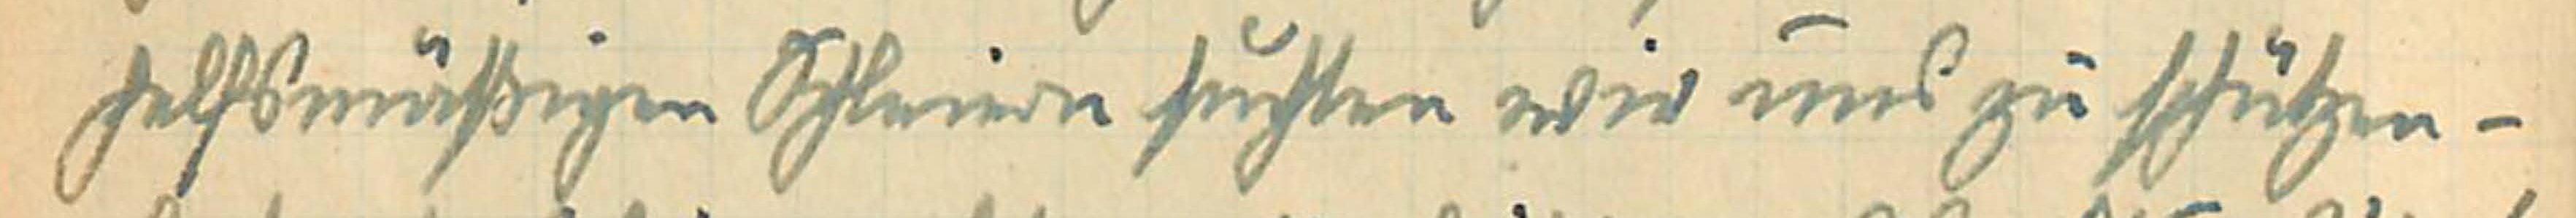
helfsmäßigen Schleiern suchten wir uns zu schützen –
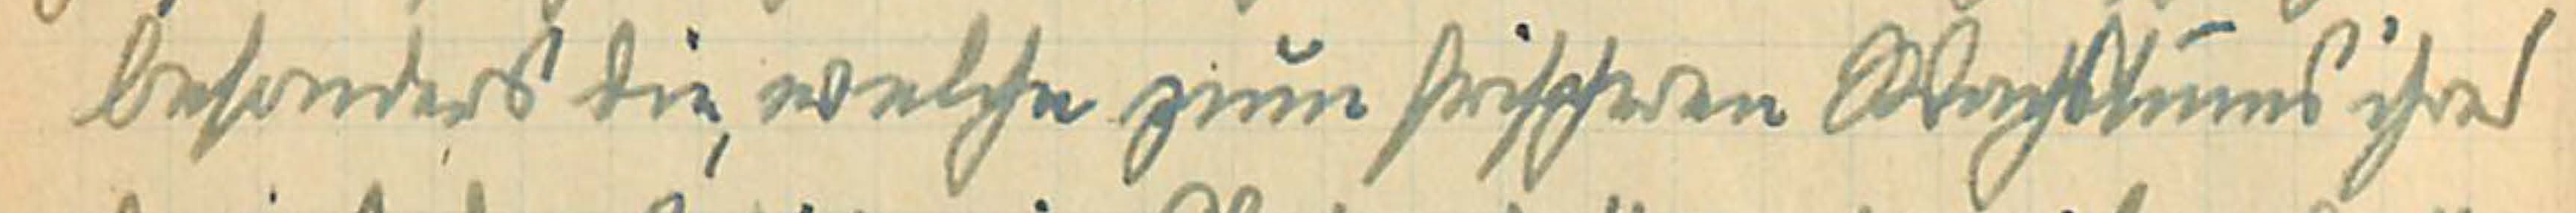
besonders die, welche zum frischeren Wachstums ihres
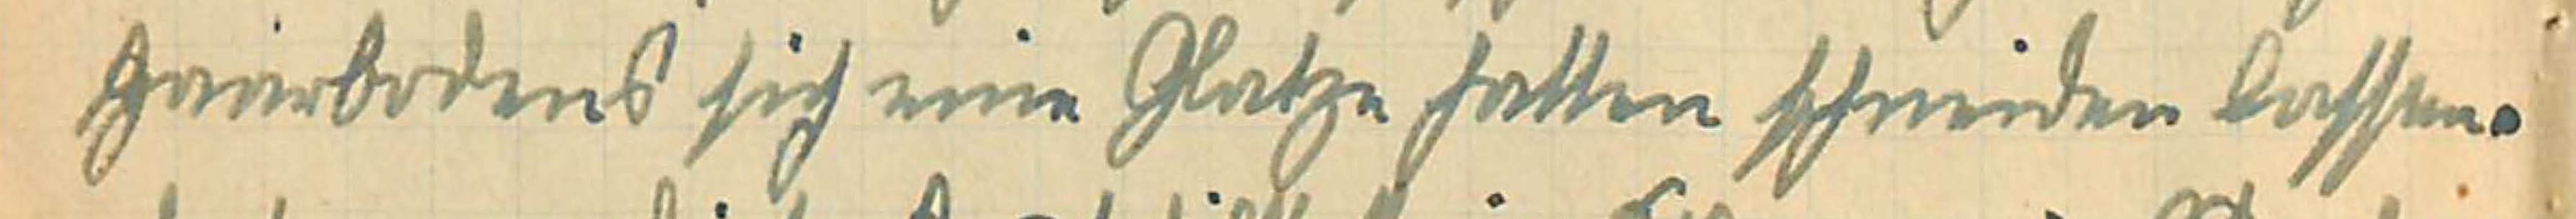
Haarbodens sich eine Glatze hatten schneiden lassen.
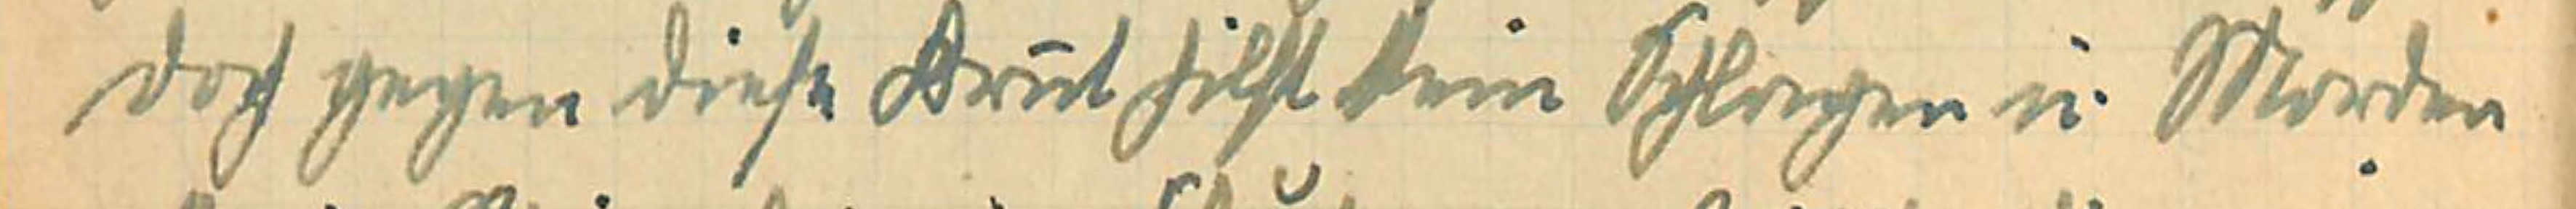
Doch gegen diese Brut hilft keine Schlagen u. Morden
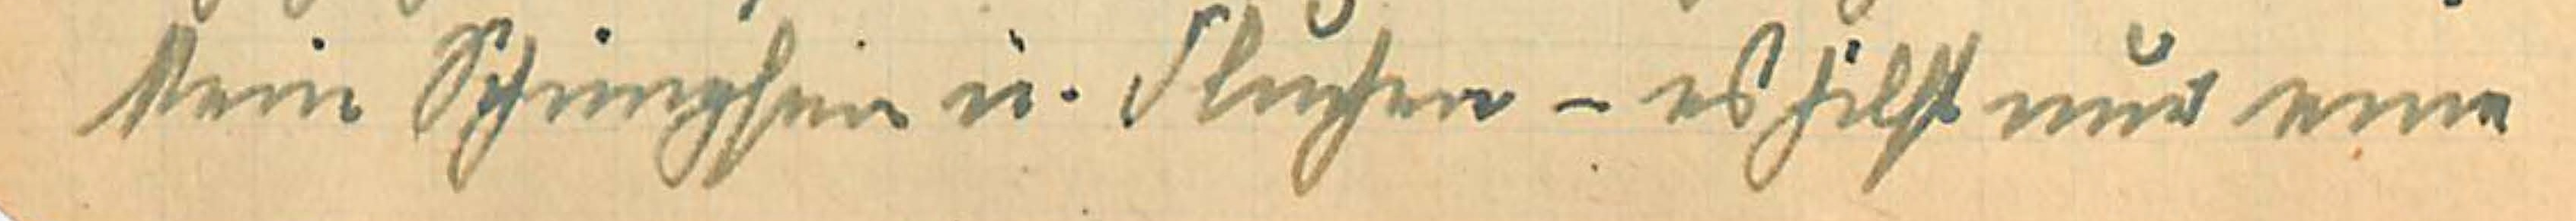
kein Schimpfen u. Fluchen – es hilft nur eine
